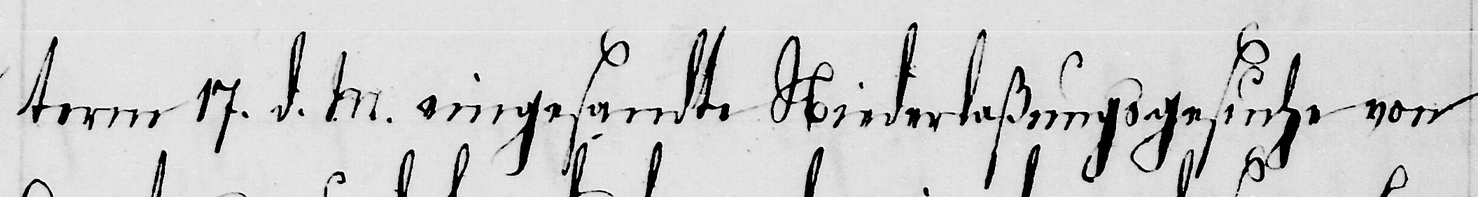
term 17. d. M. eingesandte Niederlaßungsgesuche von
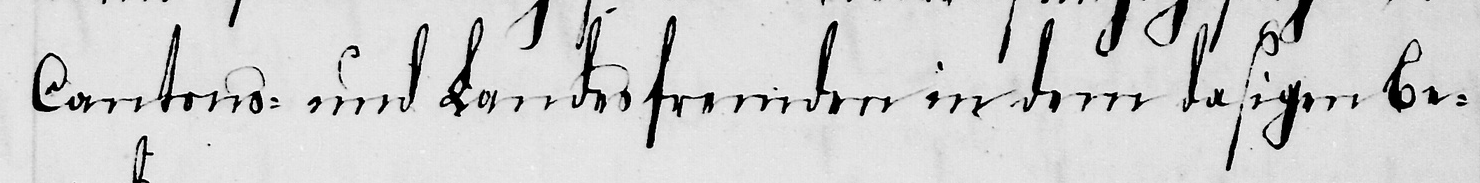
Cantons- und Landesfremden in dem dasigen Be¬
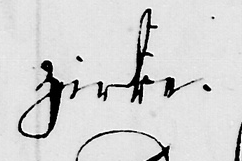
zirke.
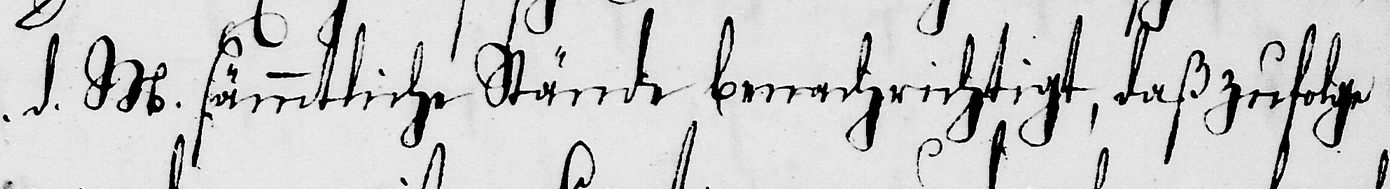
d. M. sämmtliche Stände benachrichtigt, daß zufolge
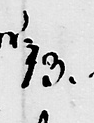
13.
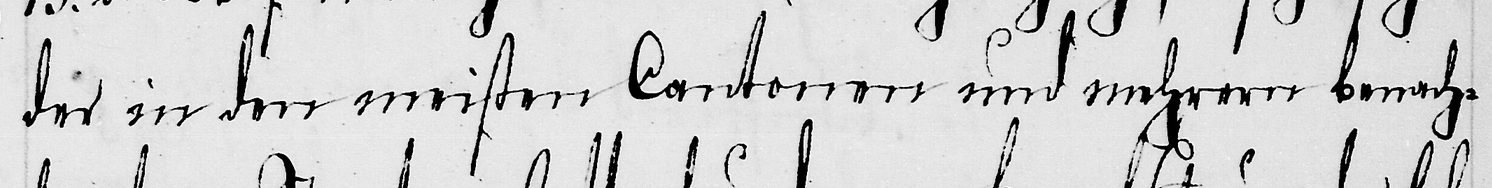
der in den meisten Cantonen und mehrern benach¬
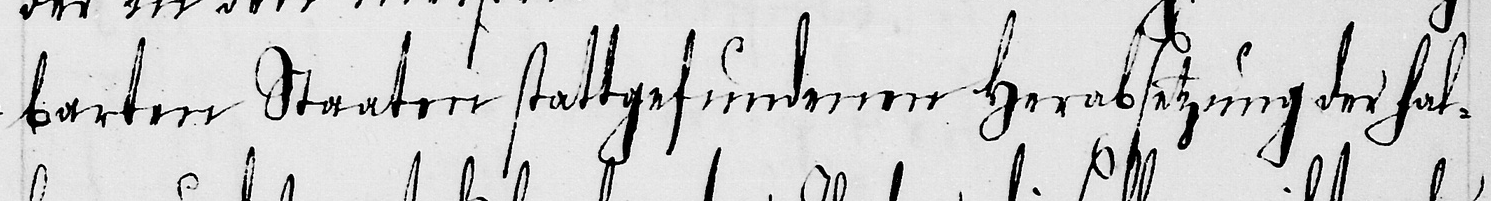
barten Staaten stattgefundenen Herabsetzung der hal¬
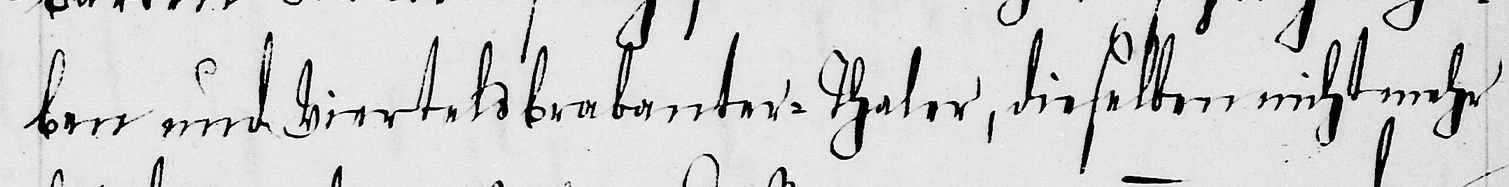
ben und Viertelsbrabanter-Thaler, dieselben nicht mehr
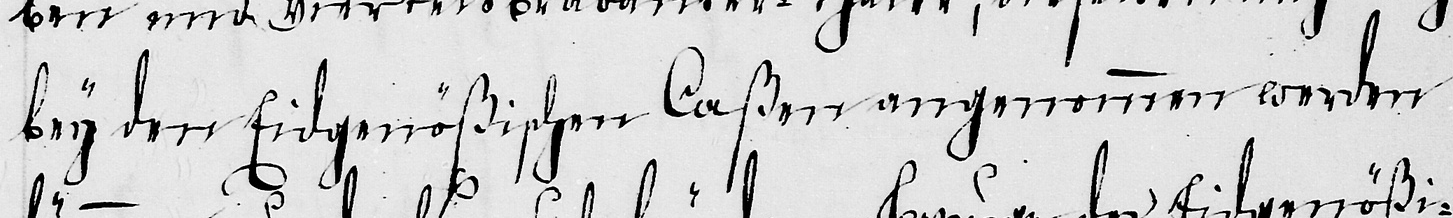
bey den Eidgenößischen Caßen angenommen werden
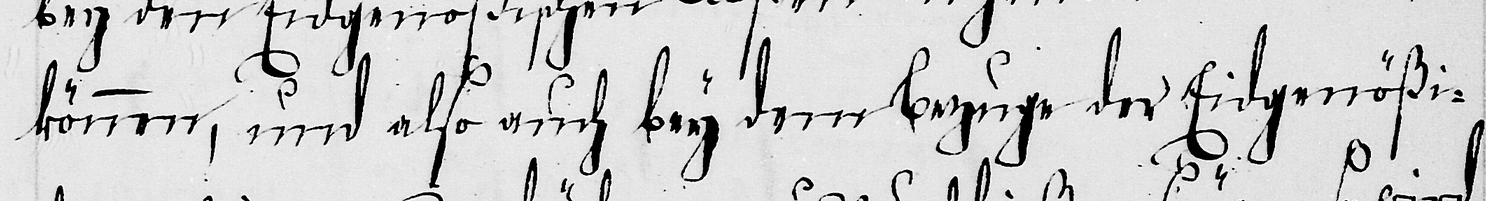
können, und also auch bey dem Bezuge der Eidgenößi¬
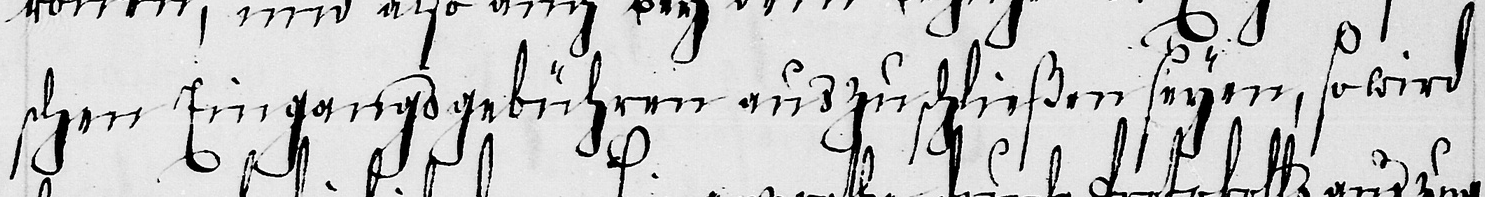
schen Einzugsgebühren auszuschließen seyen, so wird
